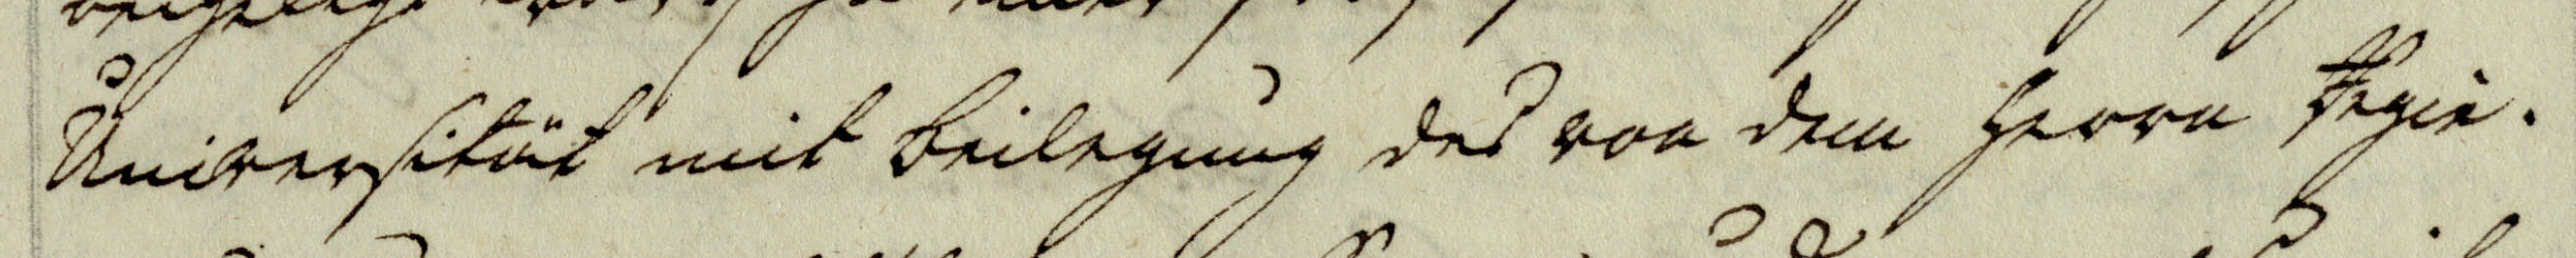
Universität mit Beilegung des von dem Herrn Regie¬
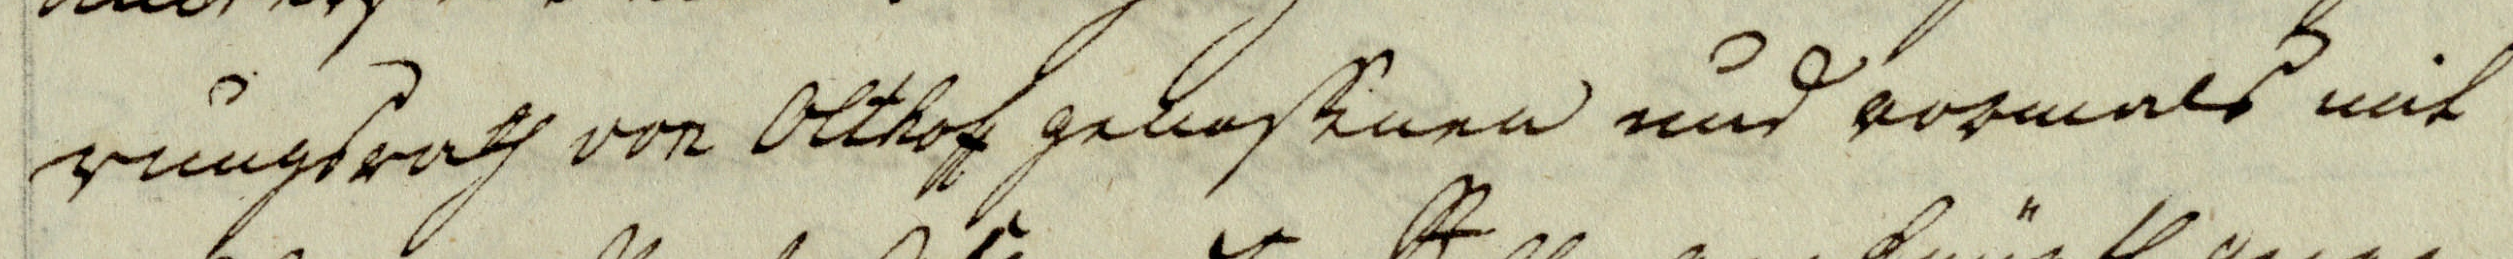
rungsrath von Olthoff genossenen und vormals mit
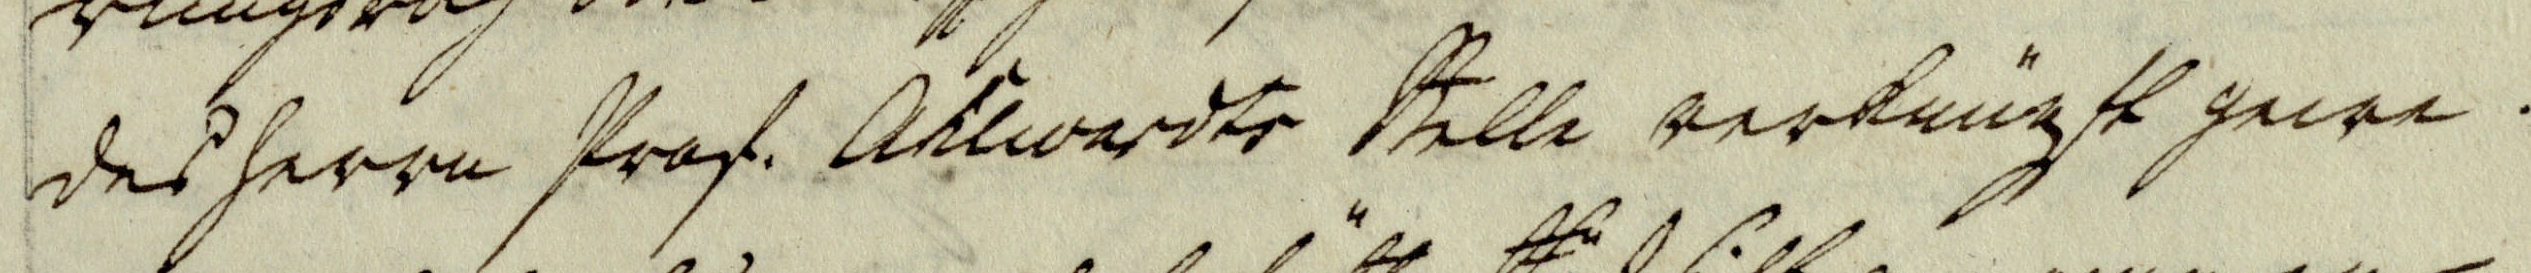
des Herrn Prof. Ahlwardts Stelle verkürzt gewe¬
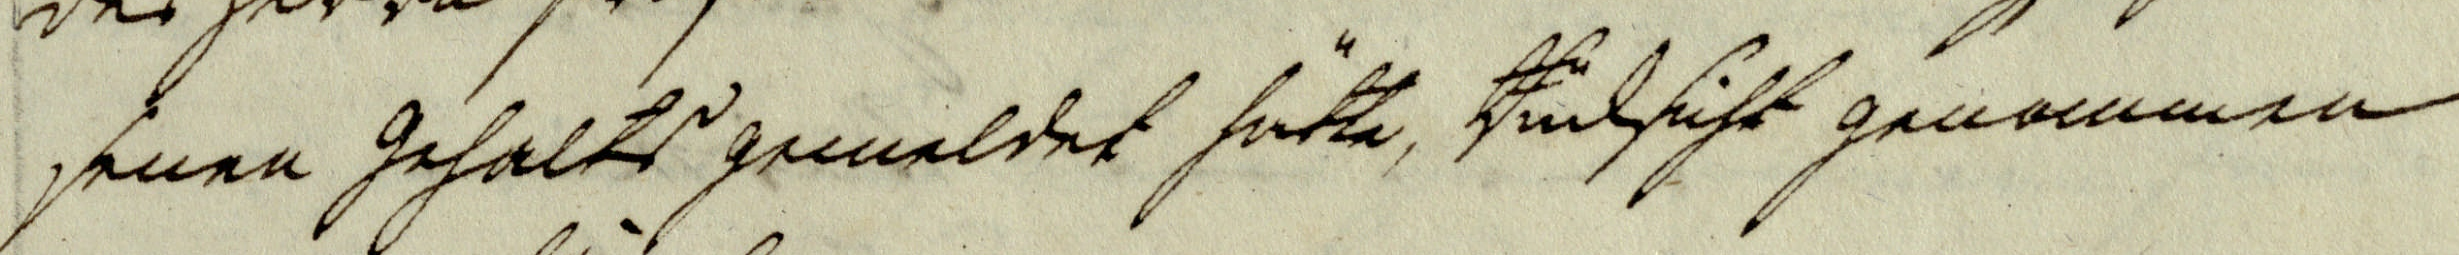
senen Gehalts gemeldet hätte, Rücksicht genommen
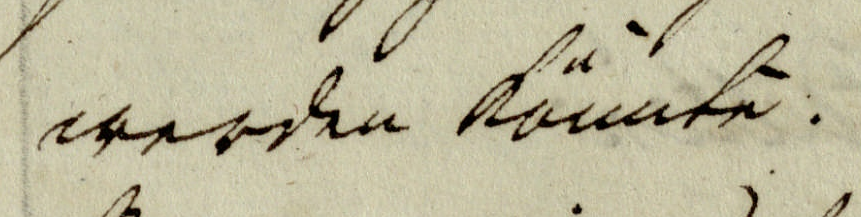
werden könnte.
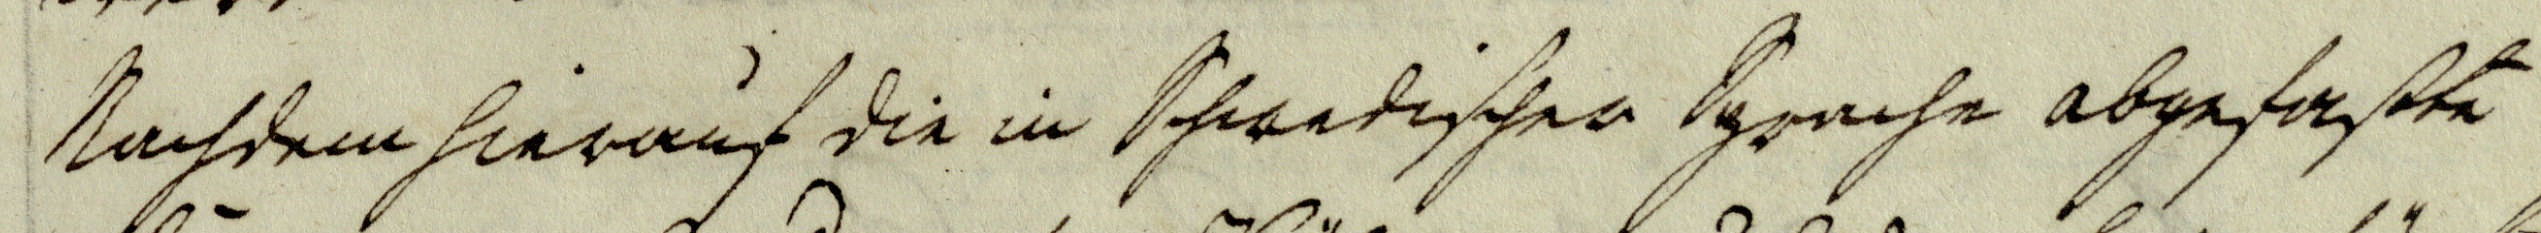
Nachdem hierauf die in Schwedischer Sprache abgefasste
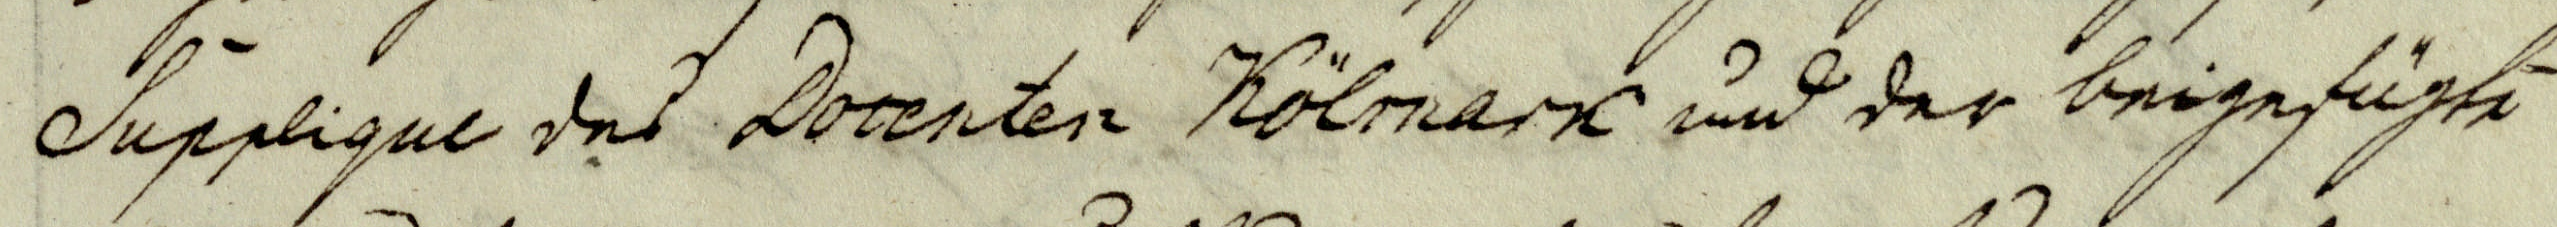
Supplique des Docenten Kölmark und der beigefügte
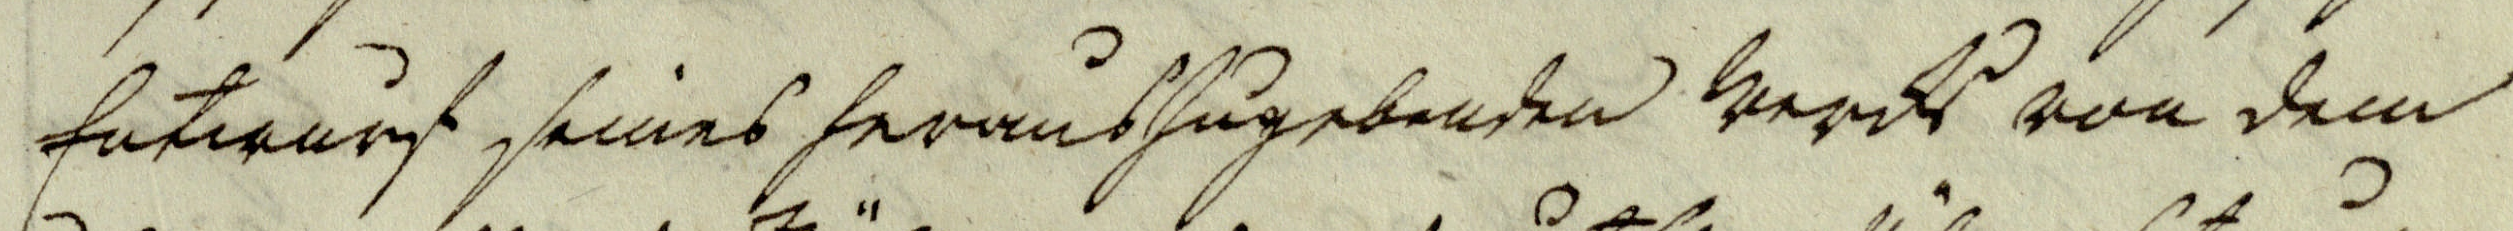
Entwurf seines herauszugebenden Wercks von dem
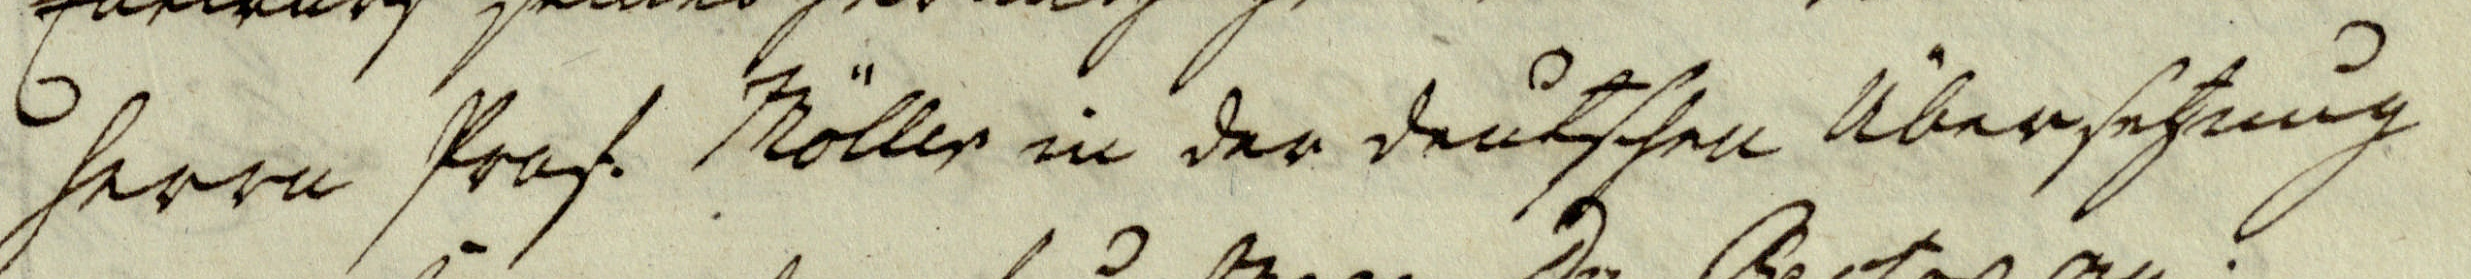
Herrn Prof. Möller in der deutschen Übersetzung
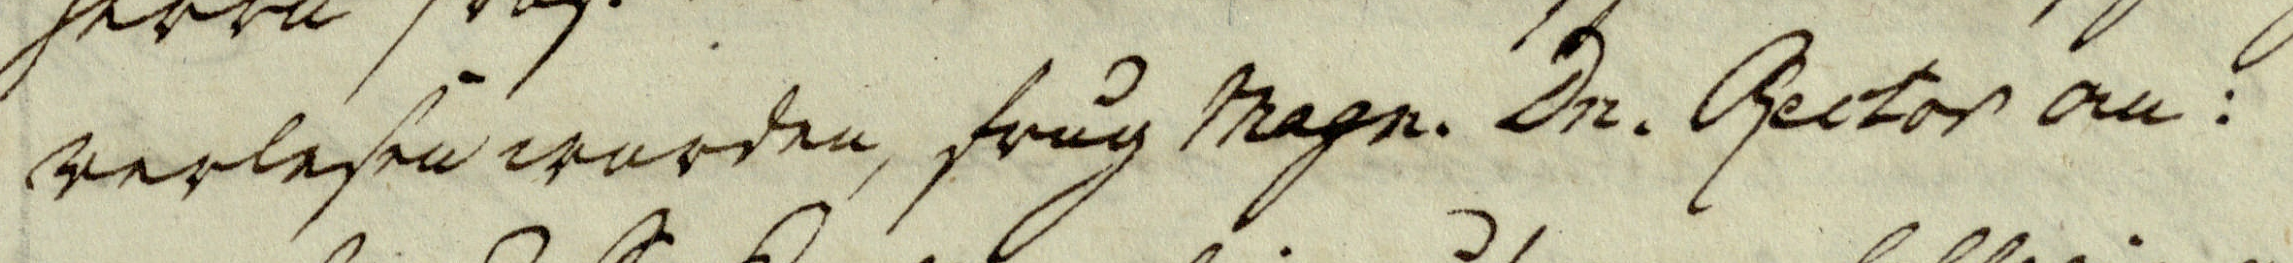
verlesen worden, frug Magn. Dn. Rector an:
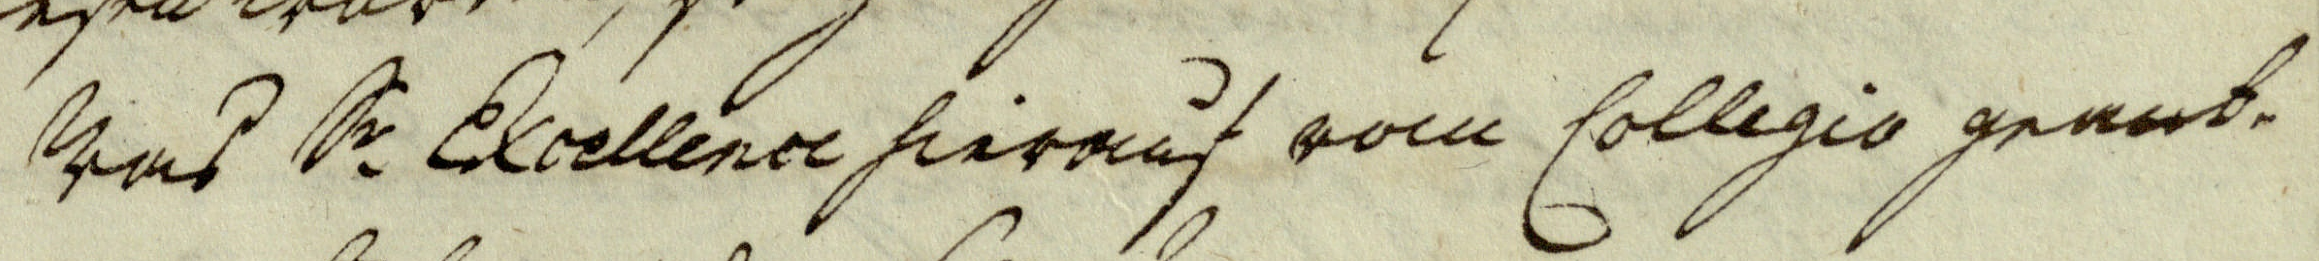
Was Sr. Excellence hierauf vom Collegio geant¬
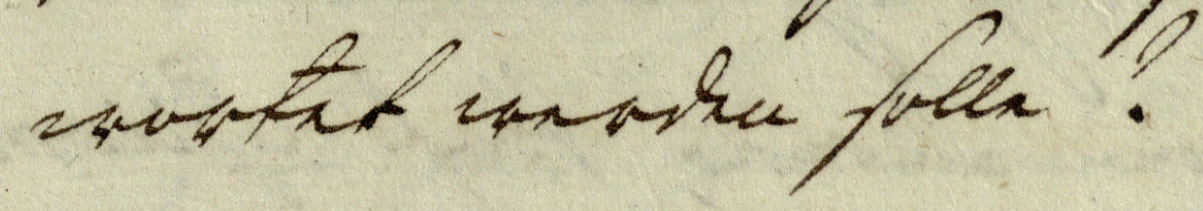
wortet werden solle?
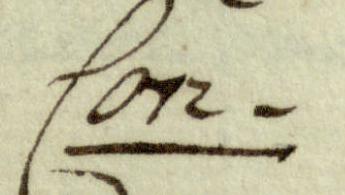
Con¬
